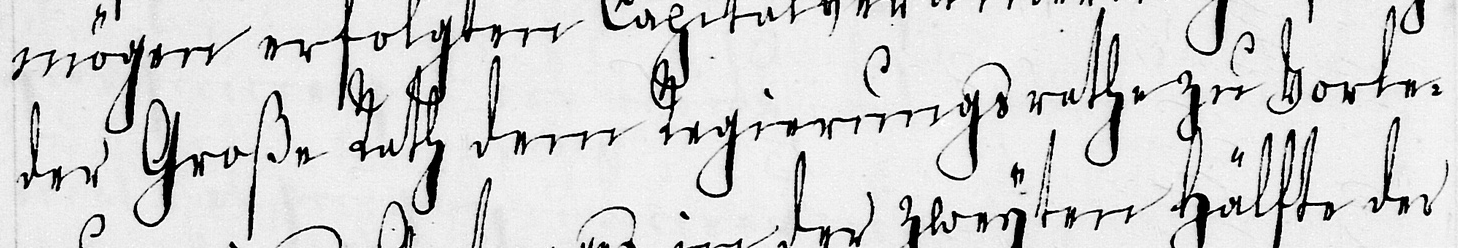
der Große Rath dem Regierungsrathe zu Vorle¬
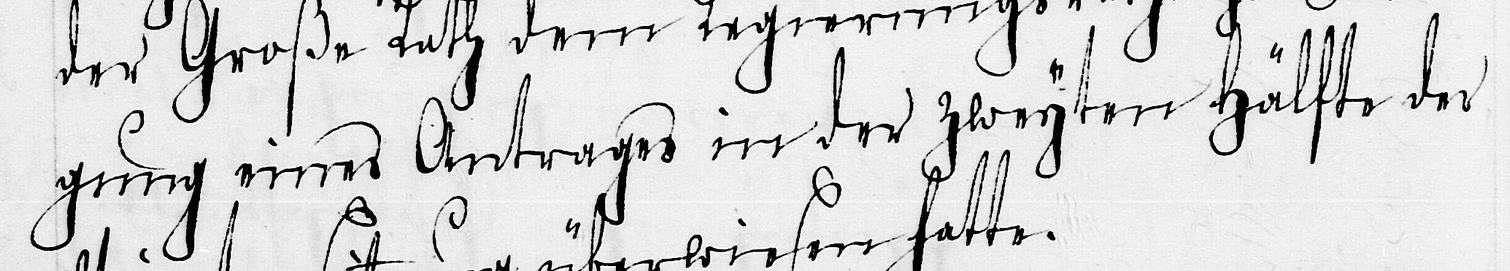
gung eines Antrages in der zweyten Hälfte der
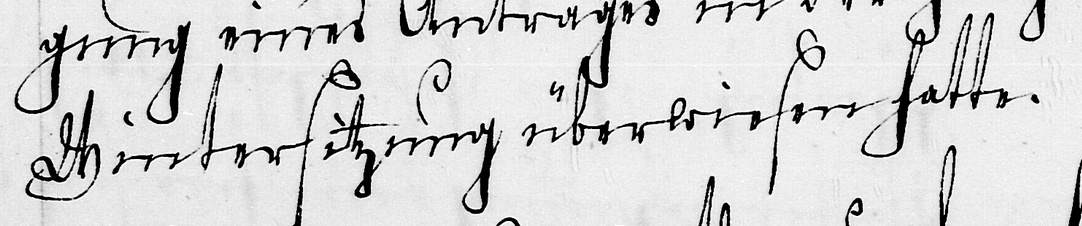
Wintersitzung überwiesen hatte.
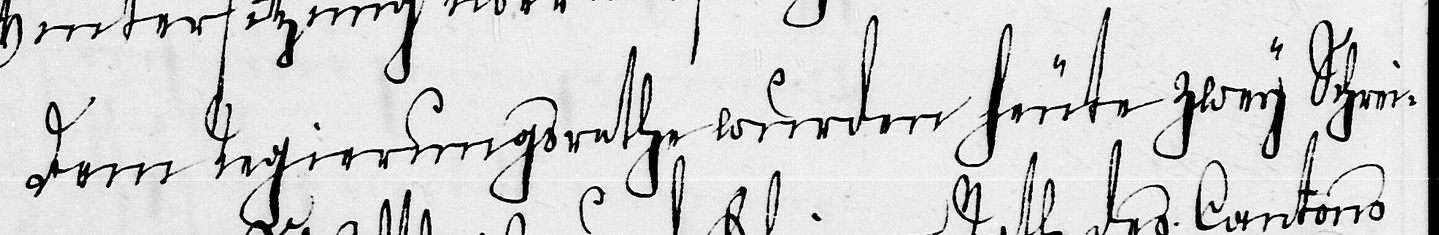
Dem Regierungsrathe wurden heute zwey Schre¬
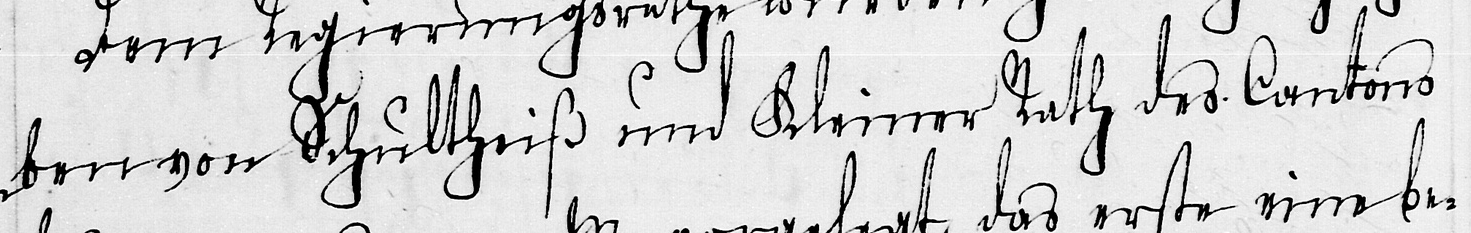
iben von Schultheiß und Kleiner Rath des Cantons
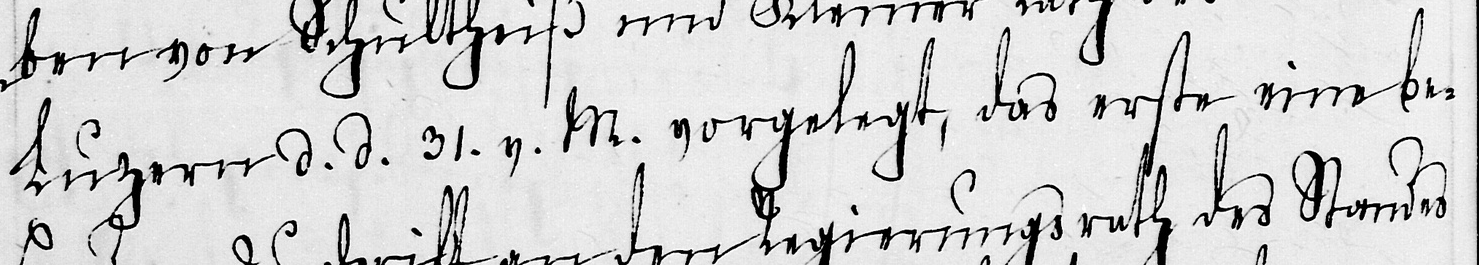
Luzern d. d. 31. v. M. vorgelegt, das erste eine be¬
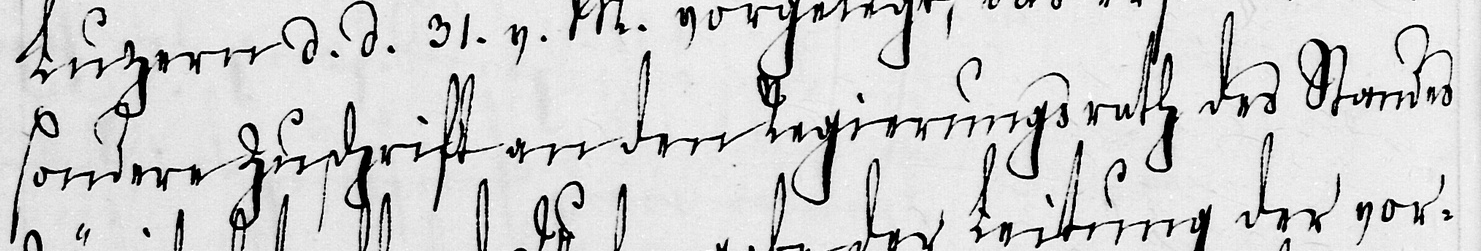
sondere Zuschrift an den Regierungsrath des Standes
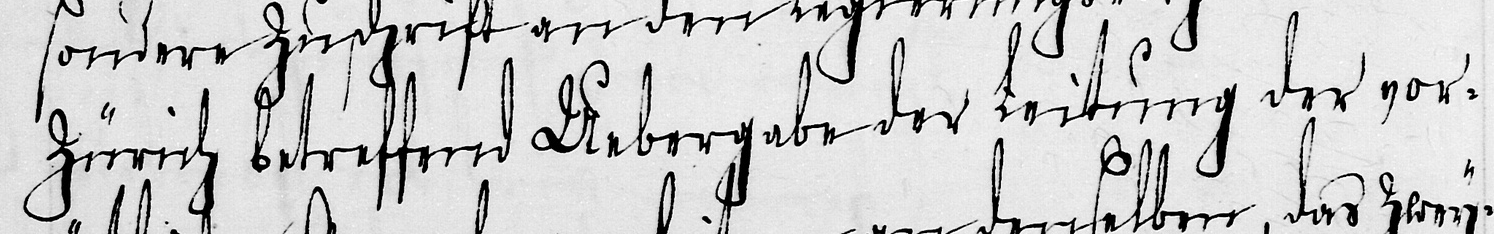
Zürich betreffend Uebergabe der Leitung der vor¬
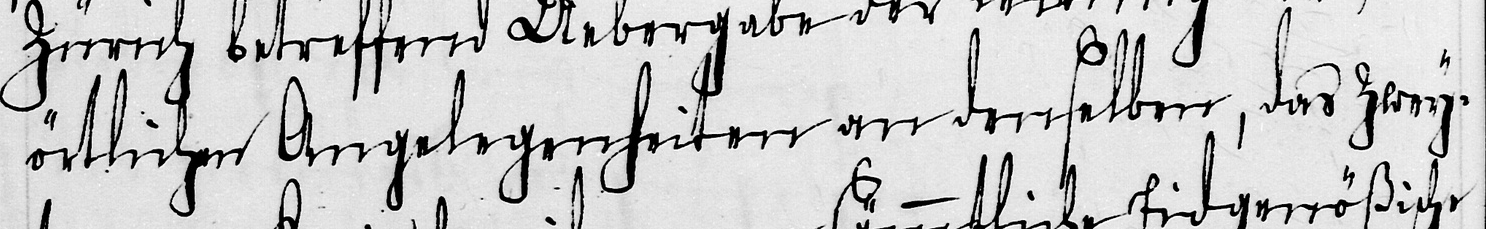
örtlichen Angelegenheiten an denselben, das zwey¬
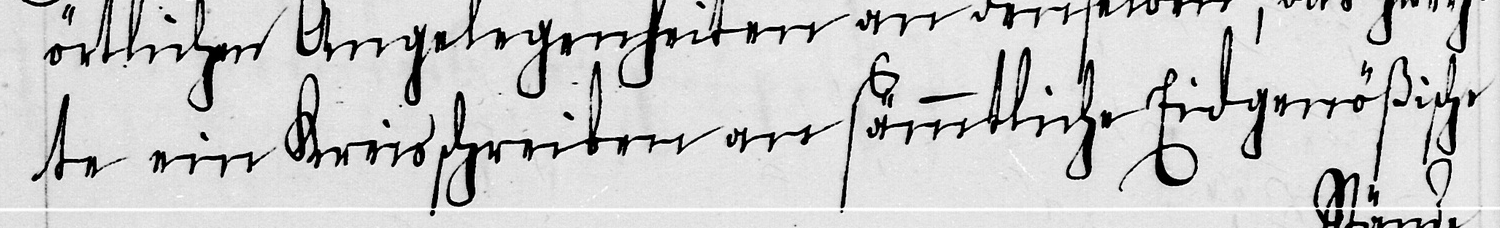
te ein Kreisschreiben an sämmtliche Edigenößische
